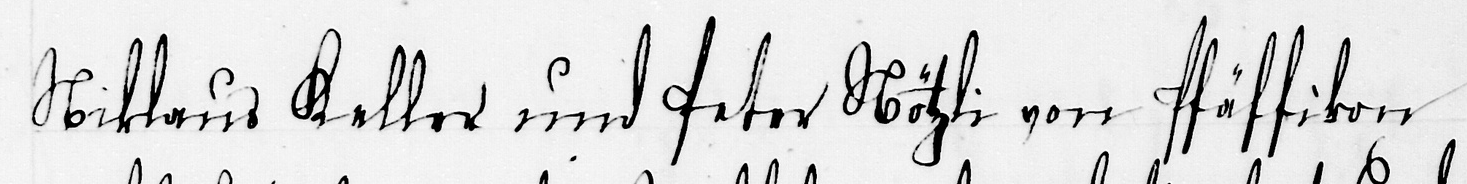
Niklaus Keller und Peter Nötzli von Pfäffikon
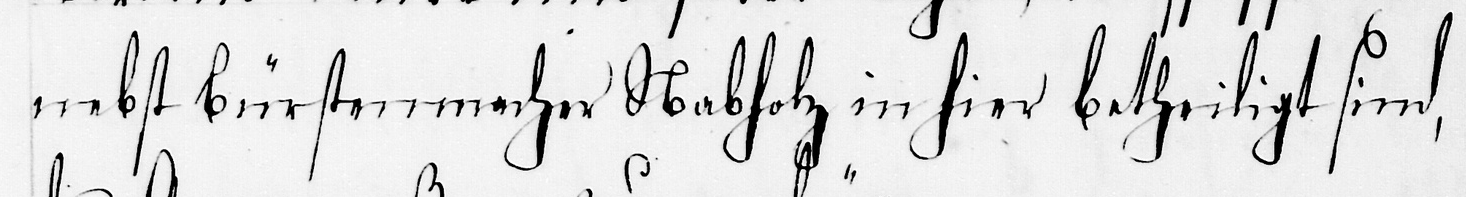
nebst Bürstenmacher Nabholz in hier betheiligt sind,
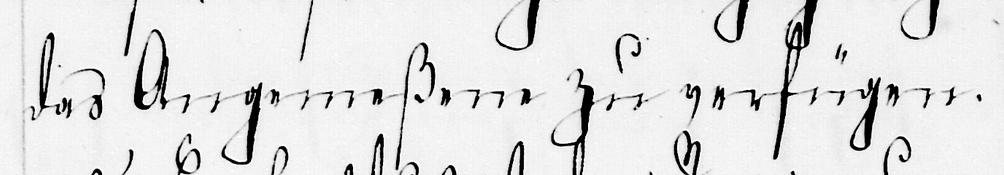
das Angemeßene zu verfügen.
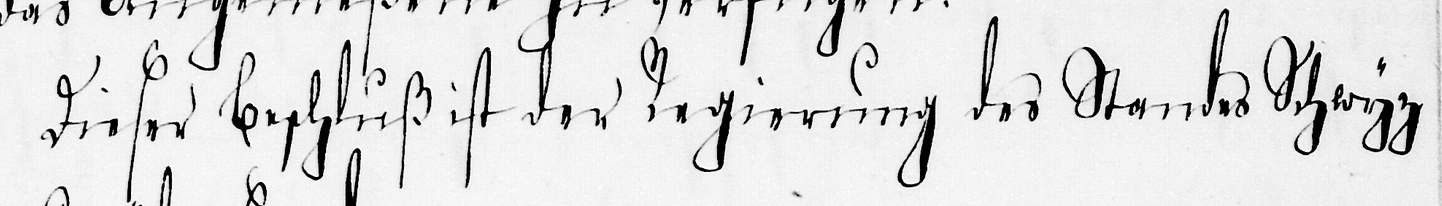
Dieser Beschluß ist der Regierung des Standes Schwyz
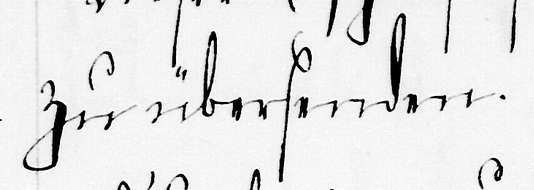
zu übersenden.
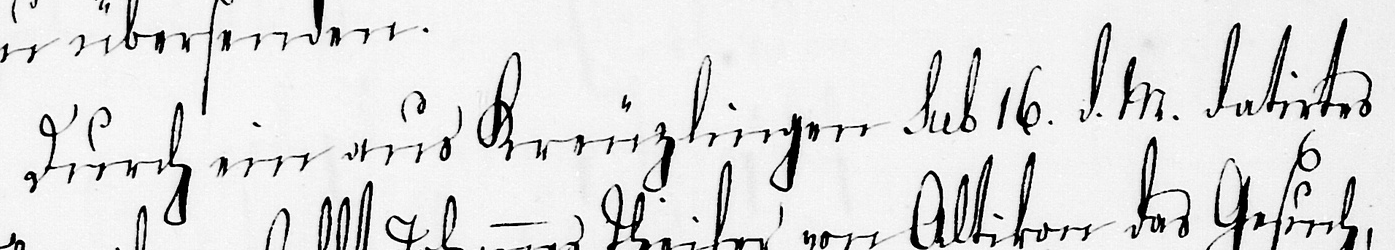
Durch ein aus Kreuzlingen sub 16. d. M. datirtes
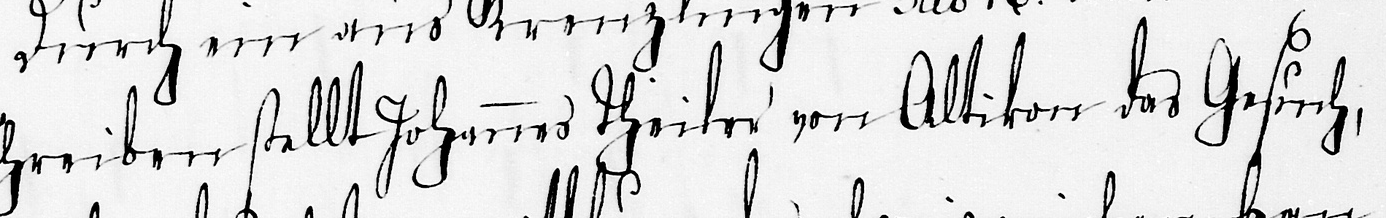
reiben stellt Johannes Theiler von Altikon das Gesuch,
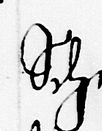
Sch¬
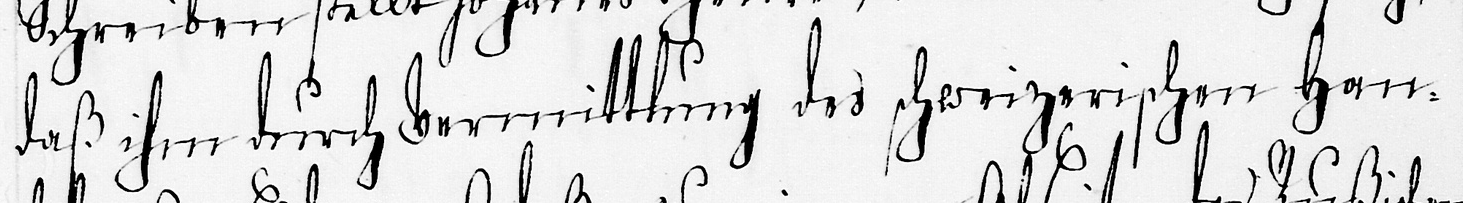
daß ihm durch Vermittlung des schweizerischen Han¬
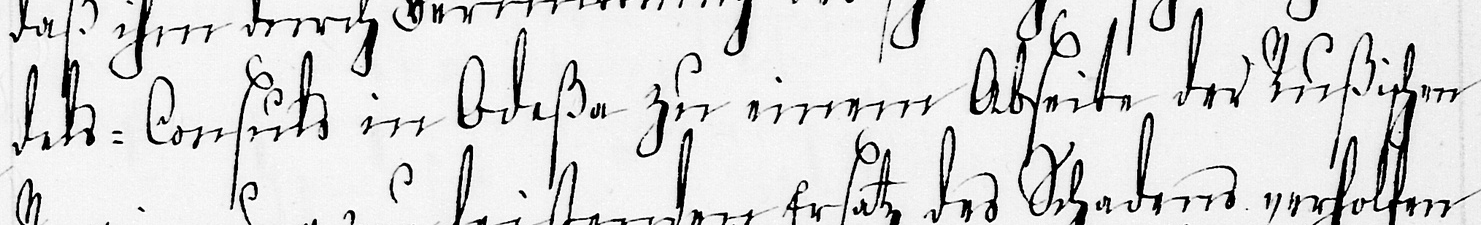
dels-Consuls in Odeßa zu einem Abseite der Rußischen
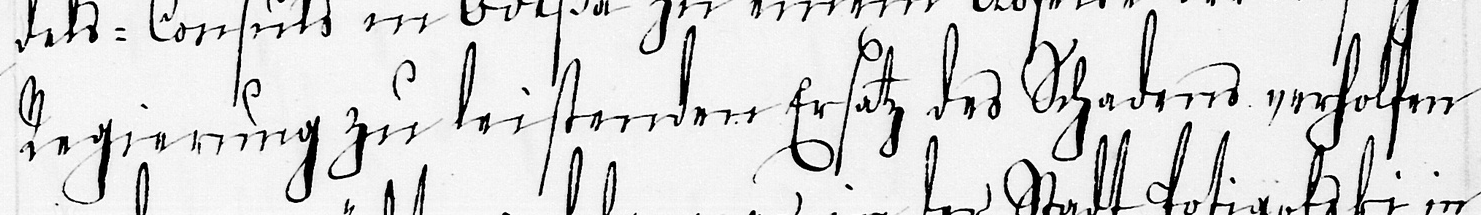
Regierung zu leistenden Ersatz des Schadens verholfen
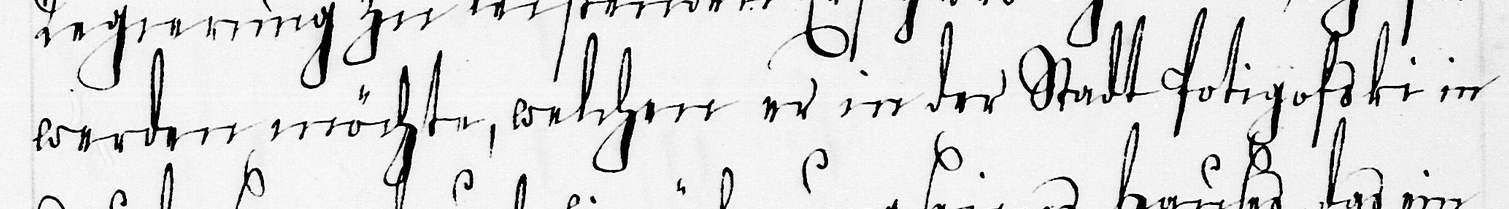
werden möchte, welchen er in der Stadt Potigofski in
